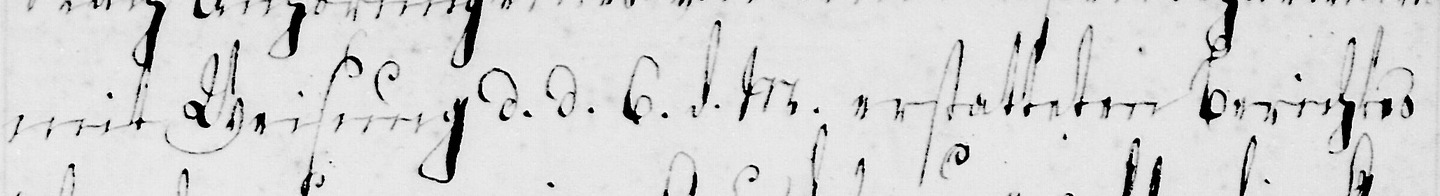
mit Weisung d. d. 6. d. M. erstatteten Berichtes
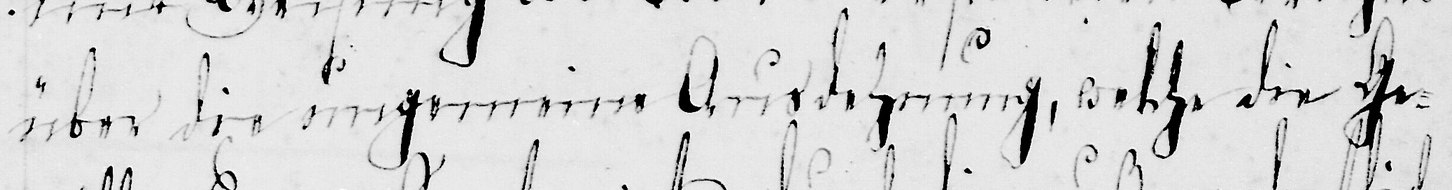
über die ungemeine Ausdehnung, welche die Ge¬
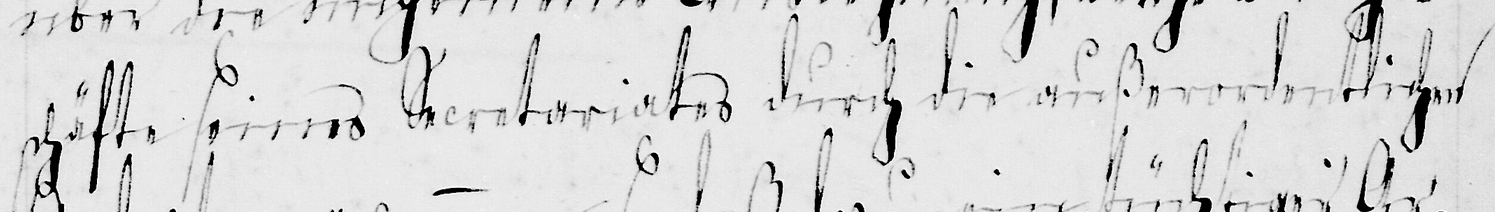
schäfte seines Secretariates durch die außerordentlichen
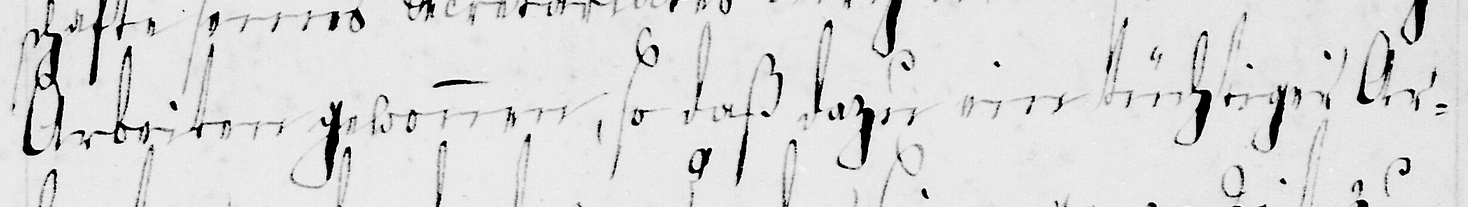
Arbeiten gewonnen, so daß dazu ein tüchtiger Ar¬
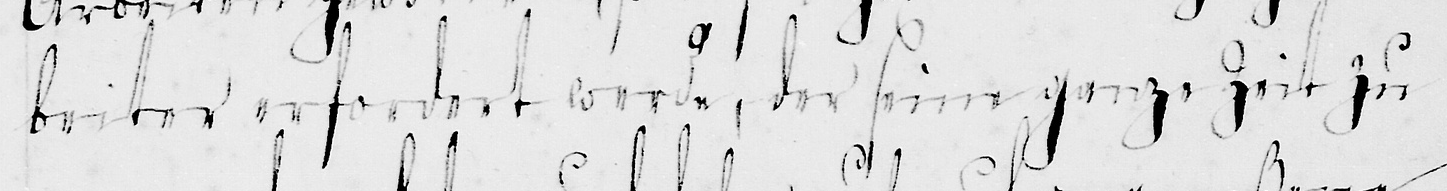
beiter erfordert werde, der seine ganze Zeit zu
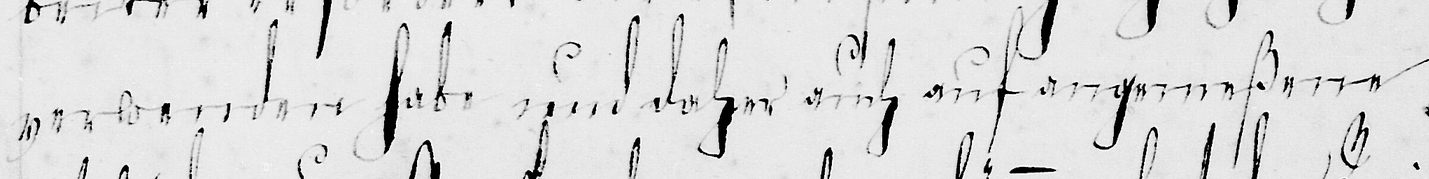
verwenden habe und daher auch auf angemeßene
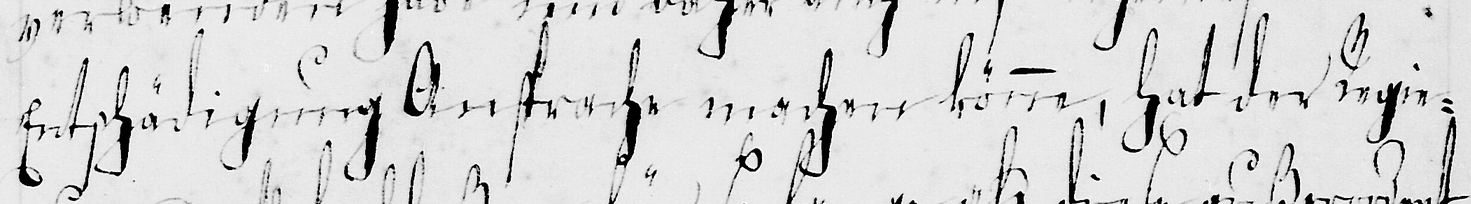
Entschädigung Ansprache machen könne, hat der Regie¬
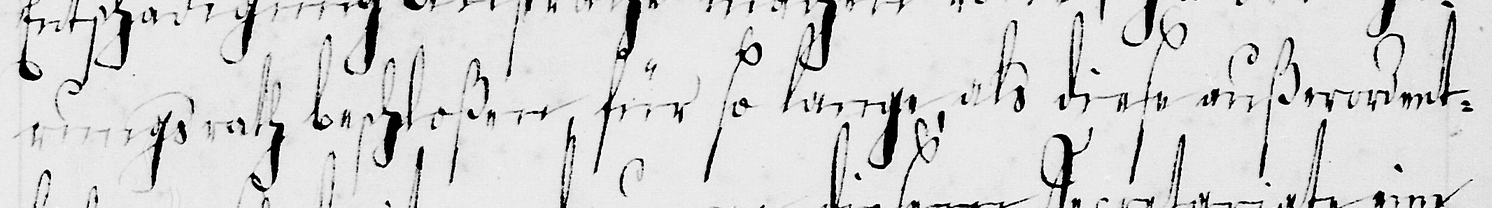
rungsrath beschloßen, für so lange, als diese außerordent¬
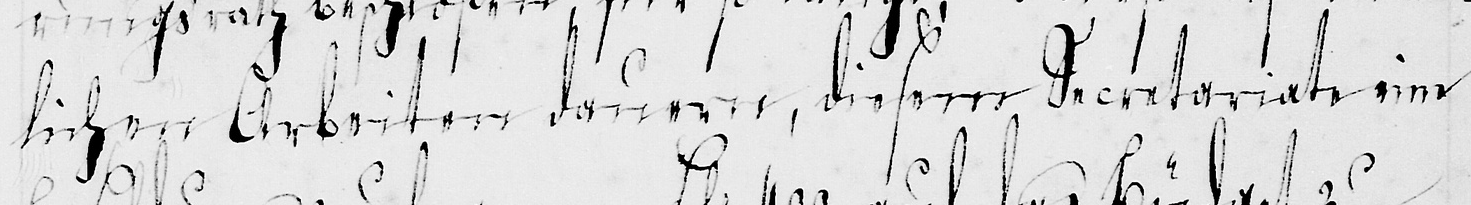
lichen Arbeiten dauern, diesem Secretariate eine
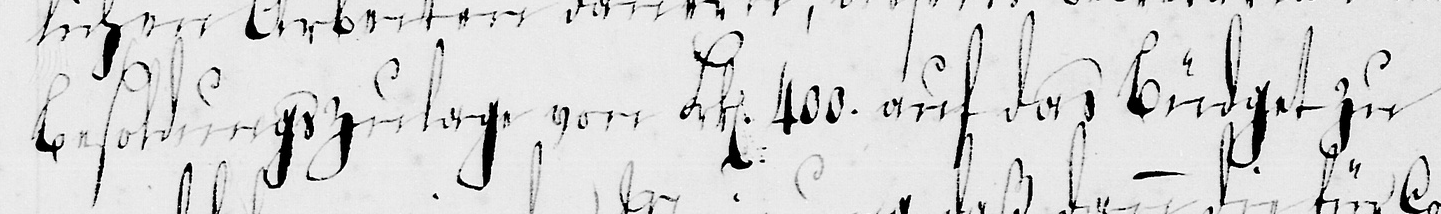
Besoldungszulage von Frk[en]. 400. auf das Büdget zu
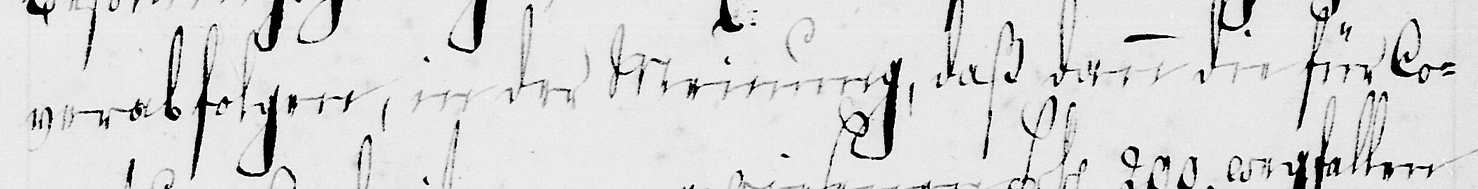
verabfolgen, in der Meinung, daß dann die für Co¬
